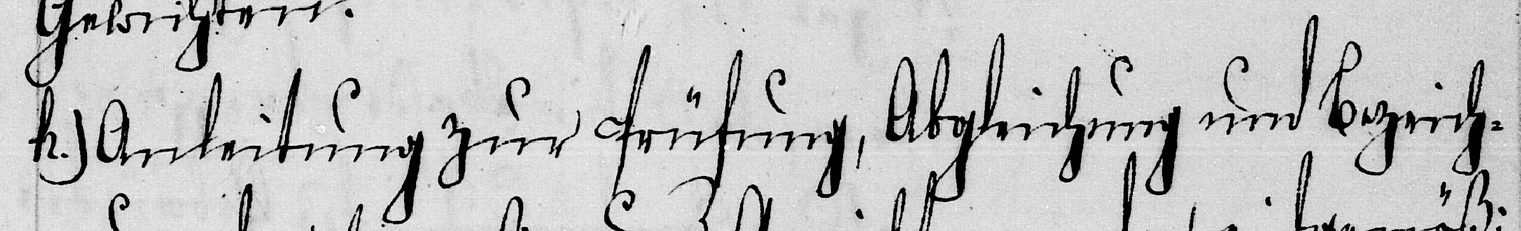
h.) Anleitung zur Prüfung, Abgleichung und Bezeich¬
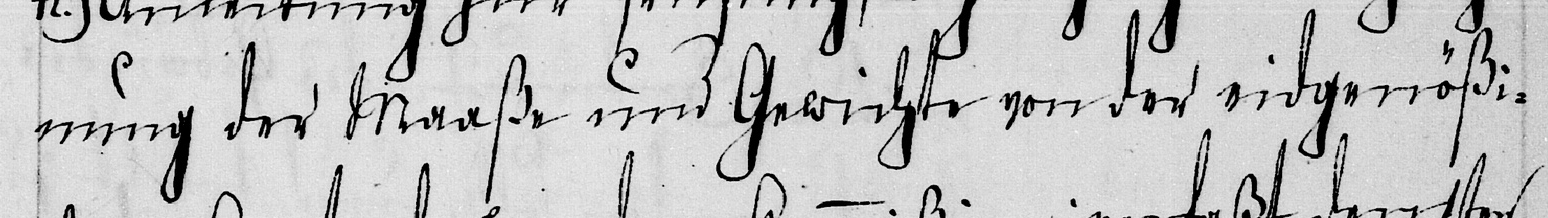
nung der Maaße und Gewichte von der eidgenößi¬
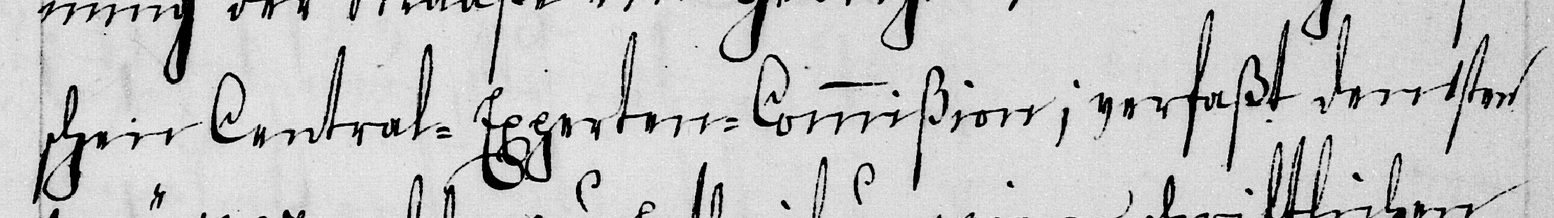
schen Central-Experten-Commißion; verfaßt den 1sten
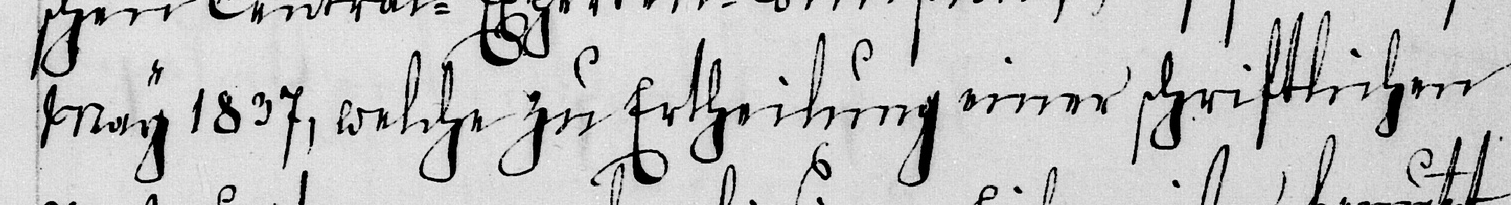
May 1837, welche zu Ertheilung einer schriftlichen
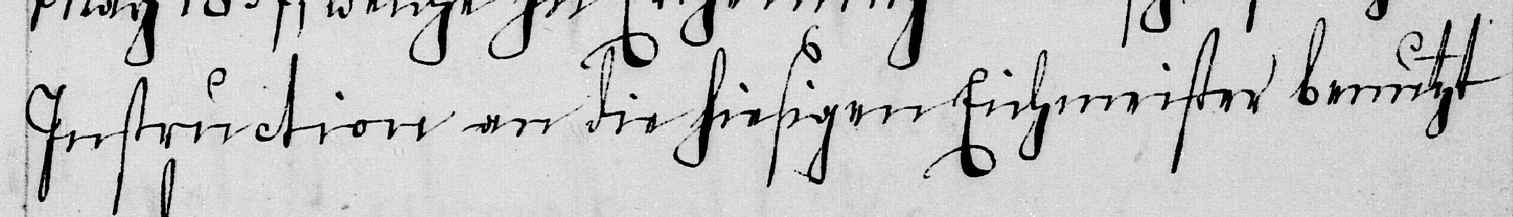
Instruction an die hiesigen Eichmeister benutzt
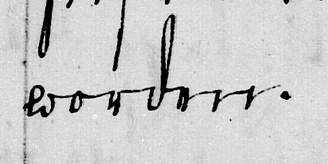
worden.
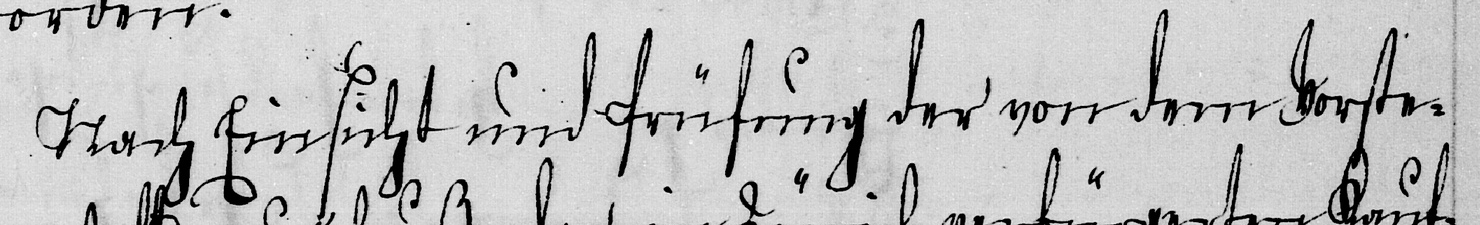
Nach Einsicht und Prüfung der von dem Vorste¬
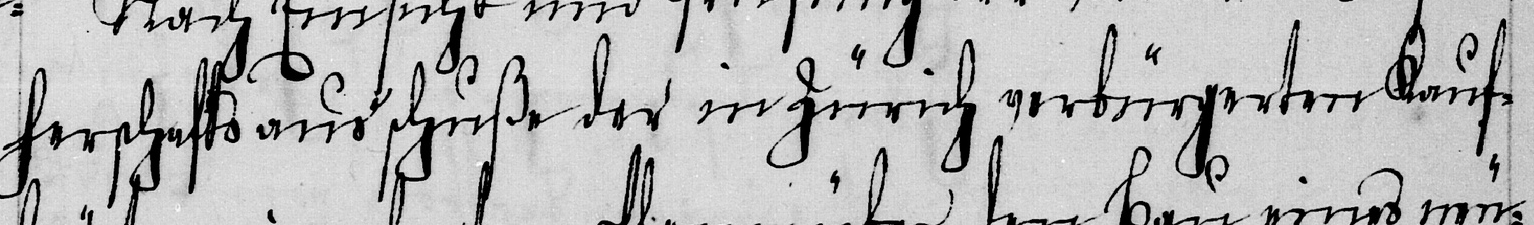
herschaftsausschuße der in Zürich verbürgerten Kauf¬
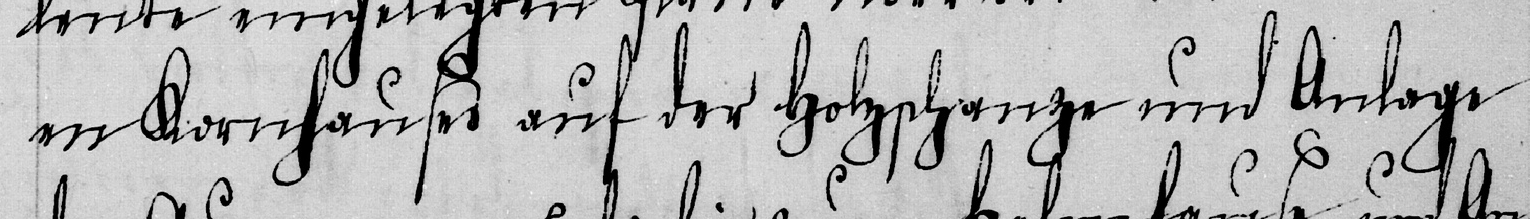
en Kornhauses auf der Holzschanze und Anlage
